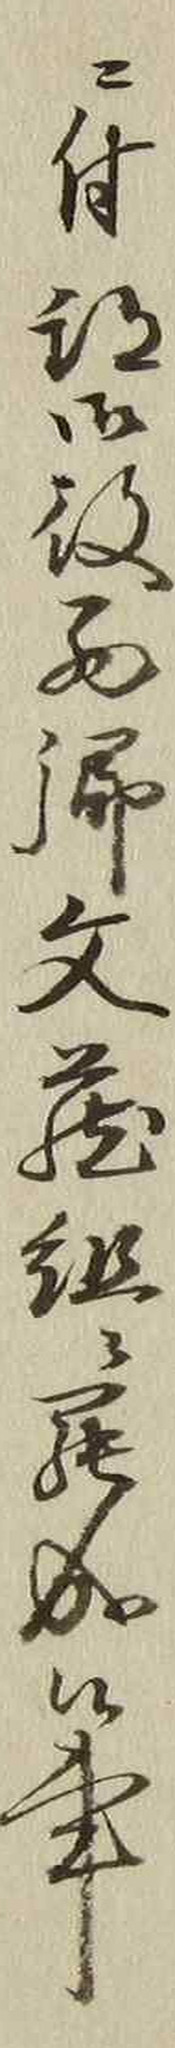ニ付跡御役西郷文蔵組ニ罷成候事
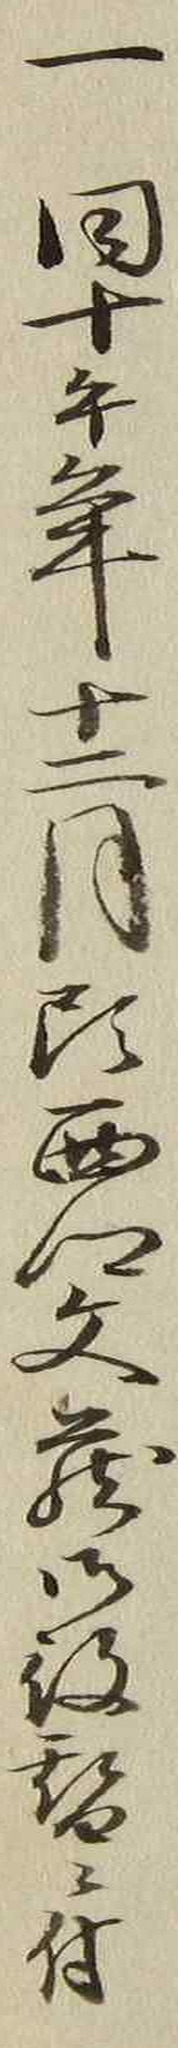一同十午年十二月頭西郷文蔵御役替ニ付
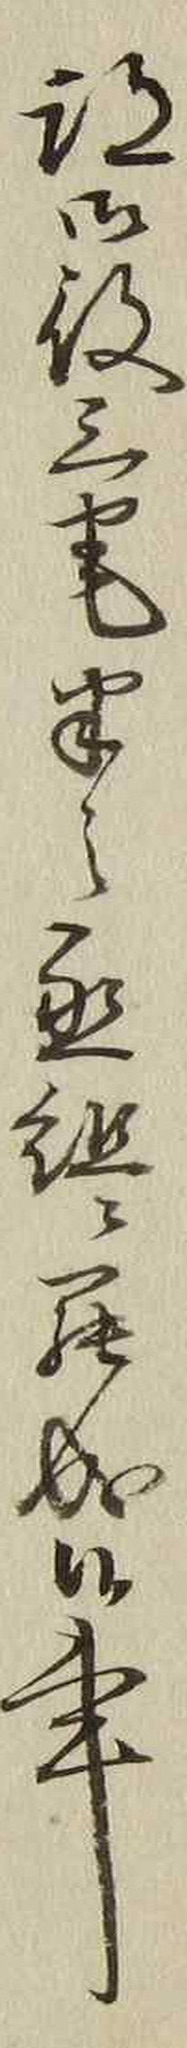跡御役三宅半之丞組ニ罷成候事
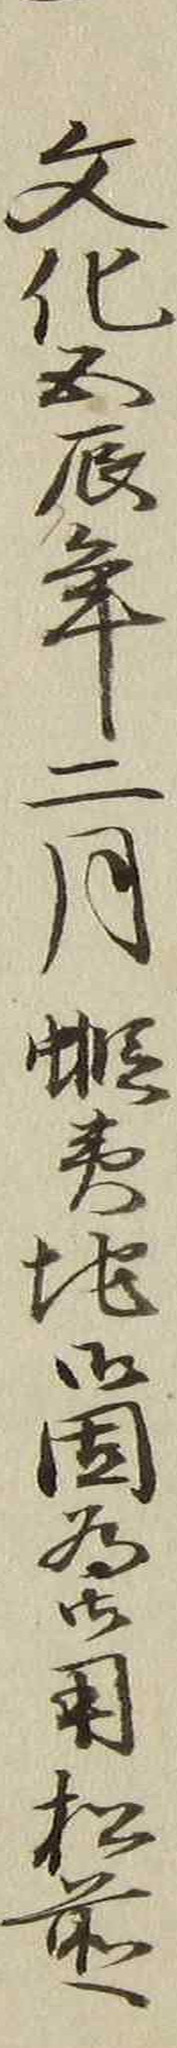一文化五辰年二月蝦夷地御固為御用松前ヘ
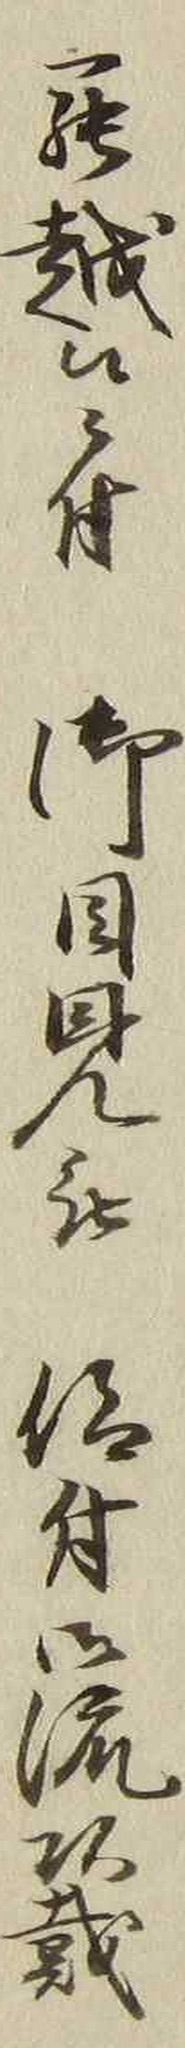罷越候ニ付御目見被仰付御流頂戴
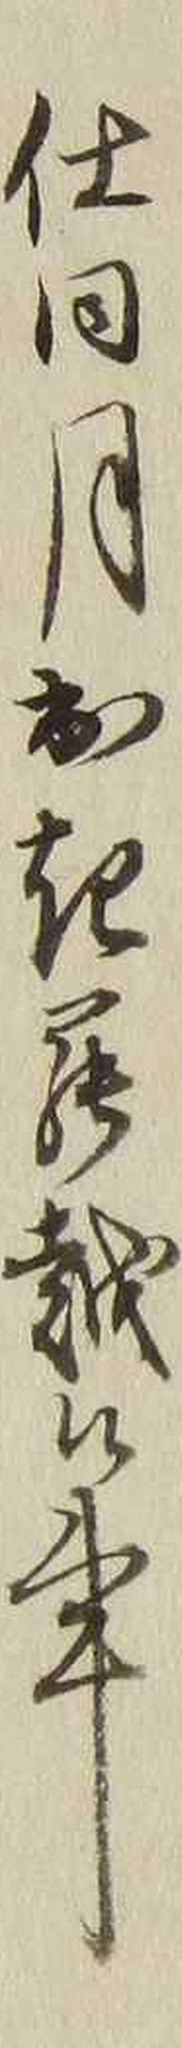仕同月出起罷越候事
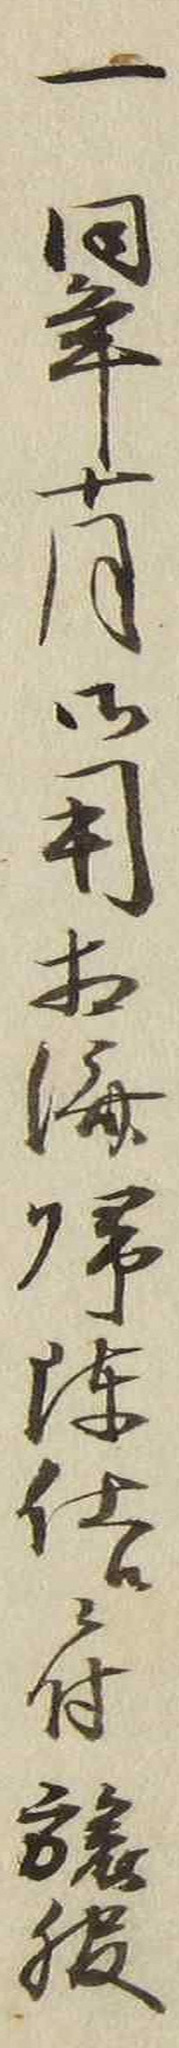一同年十月御用相済帰陳仕候ニ付旅服
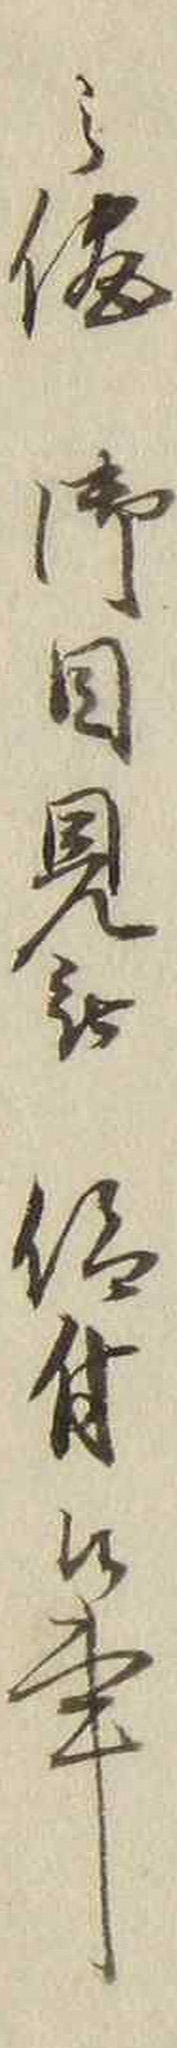之侭御目見被仰付候事

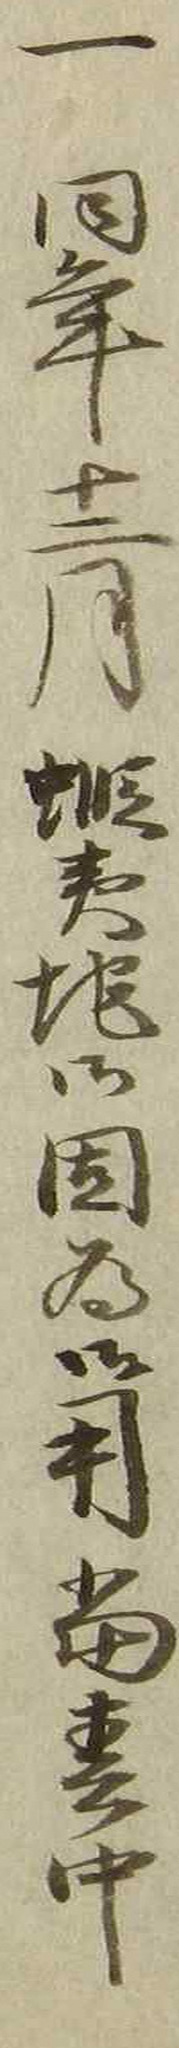一同年十二月蝦夷地御固為御用当春中
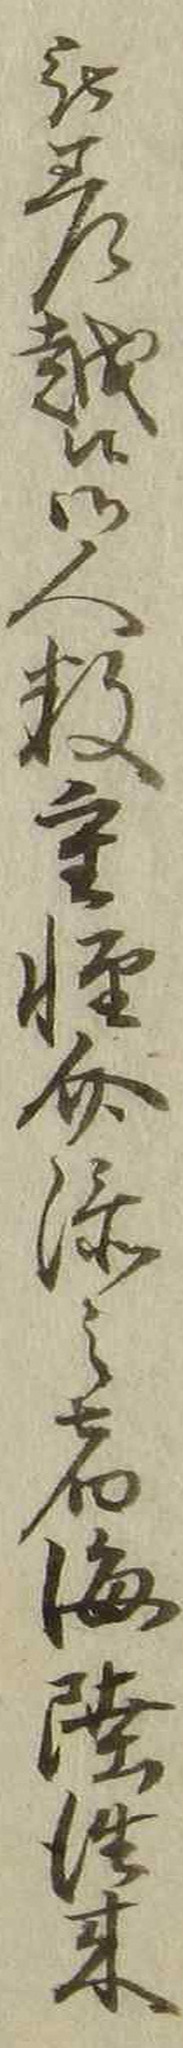被差越候御人数重軽介添之者海陸往来
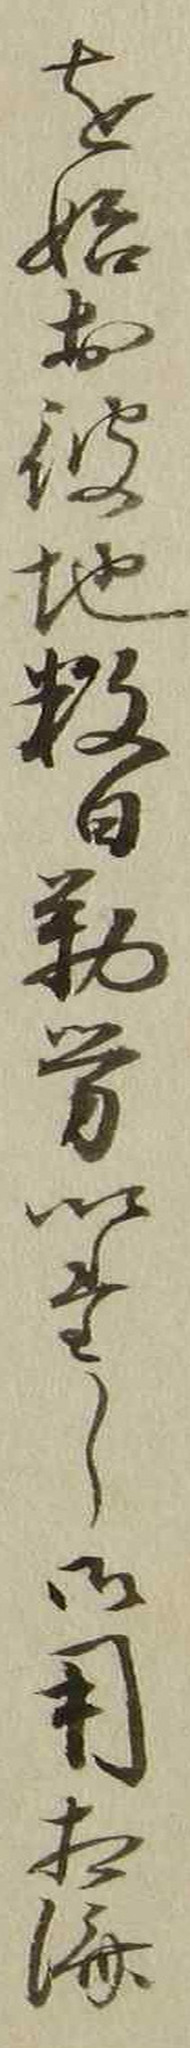を始お彼地数日勤労いたし御用相済
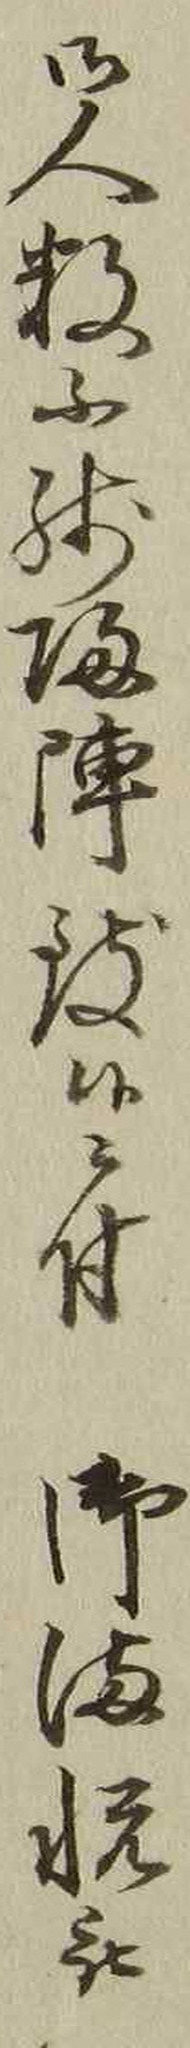御人数ふ残帰陣致候ニ付御満悦被
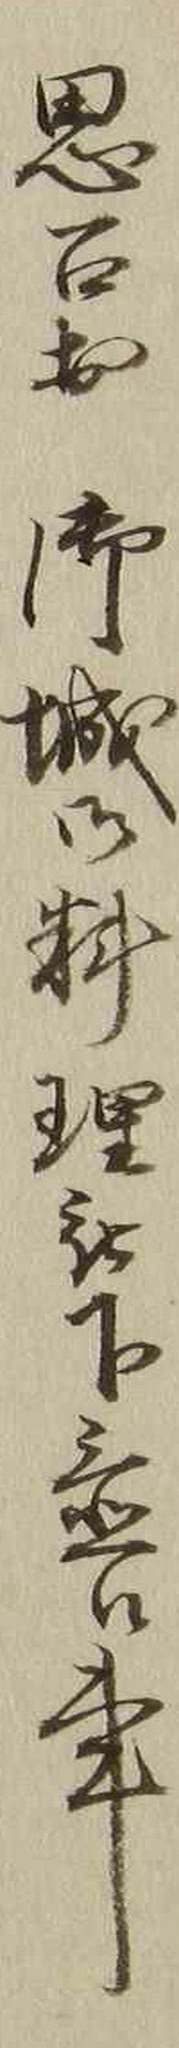思召お御城御料理被下置候事
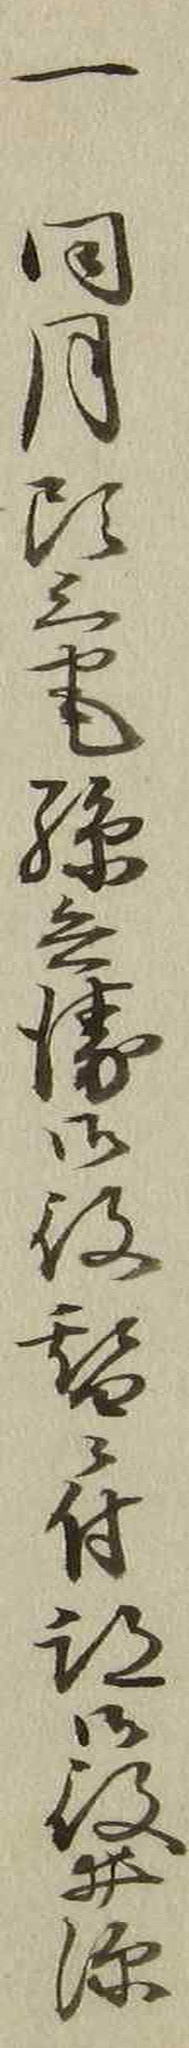一同月頭三宅孫兵衛御役替ニ付跡御役井深
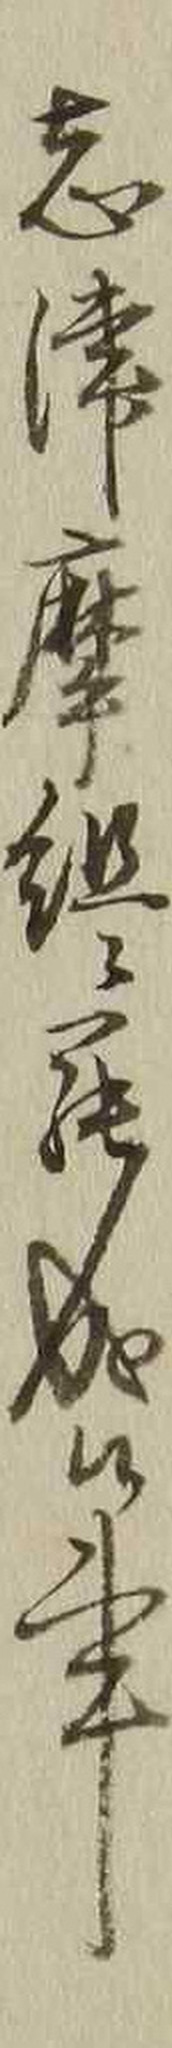志津摩組ニ罷成候事
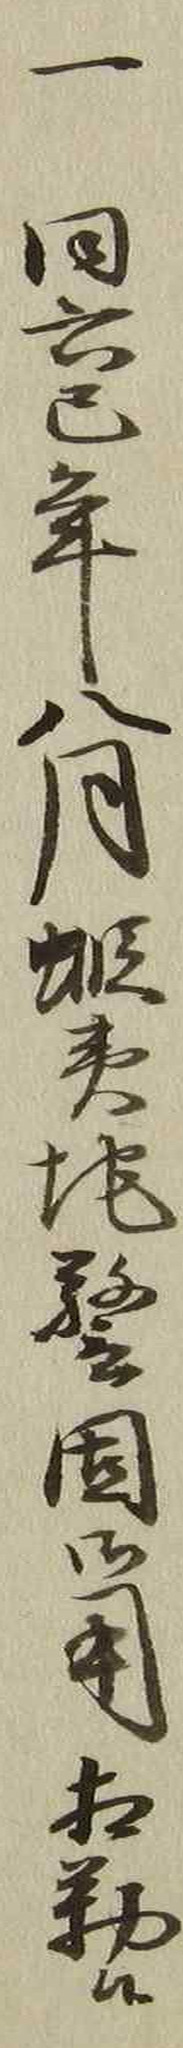一同六巳年八月蝦夷地警固御用相勤候
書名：諸士系譜　巻之114　か之部22
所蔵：会津若松市立会津図書館
